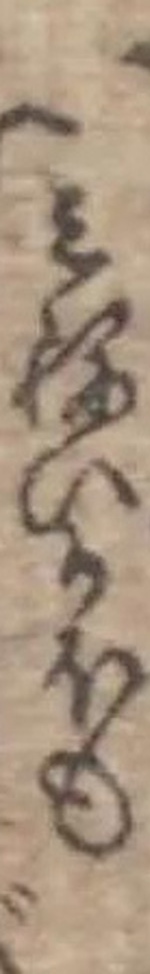ミねいかほも
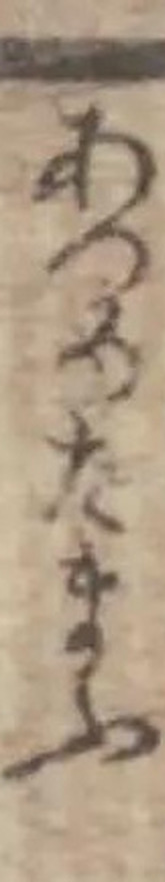あつめたまふ
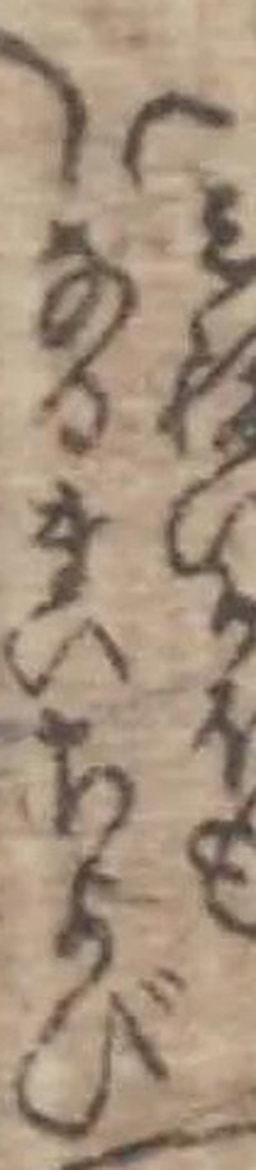なるまいちよび
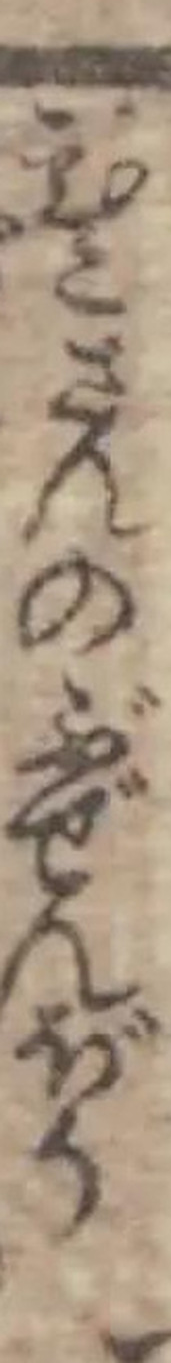ひこさんのぶぜんぼう
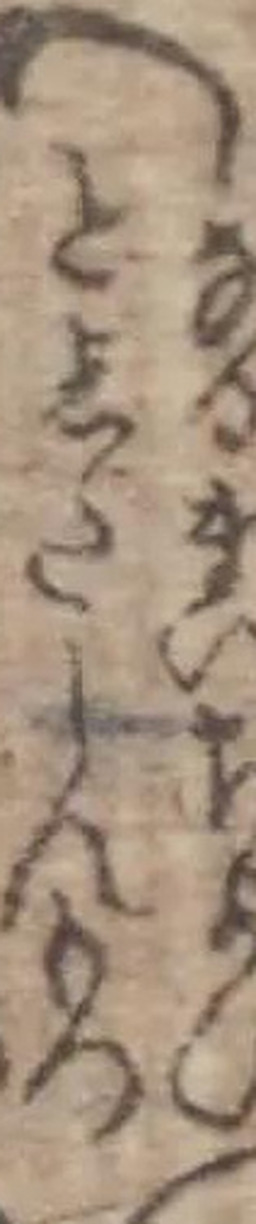としたしんもつ
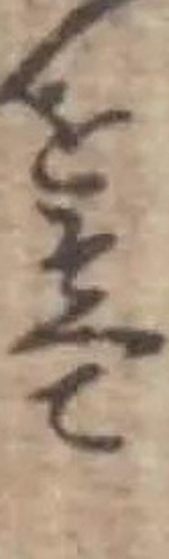をそへて
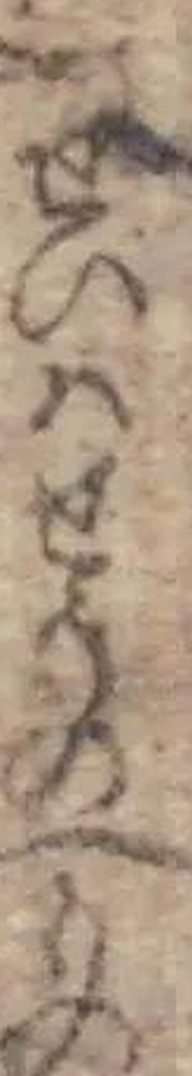せいハせうのもの
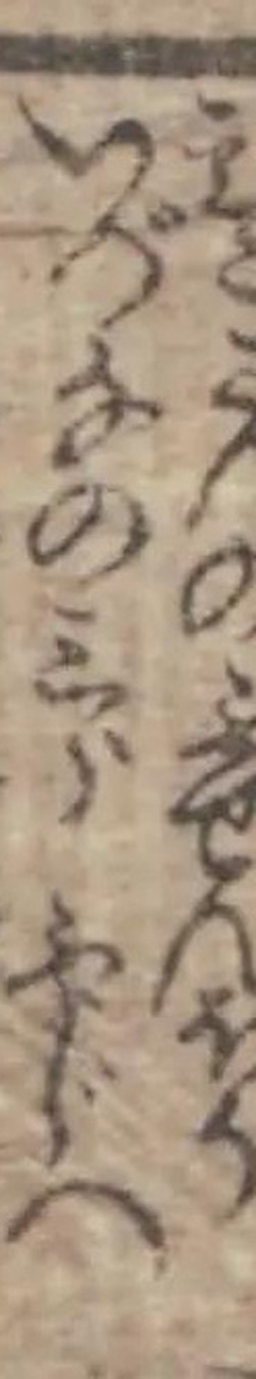いづなの三郎ふじ
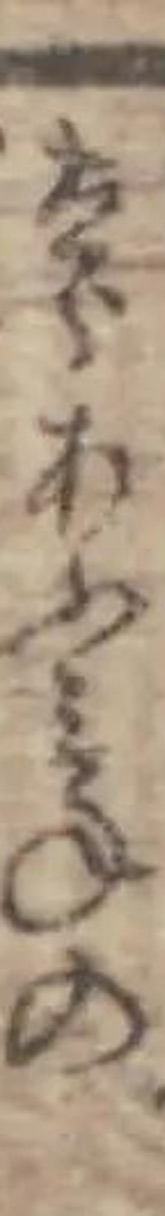太郎あふミねの
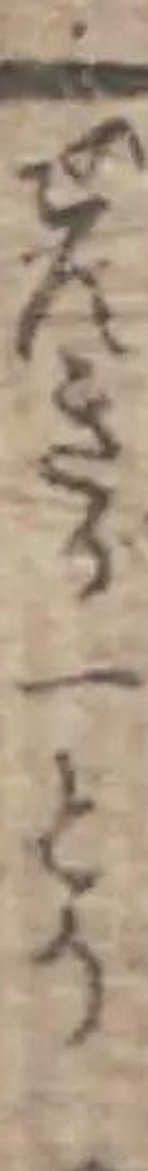ぜんきが一とう
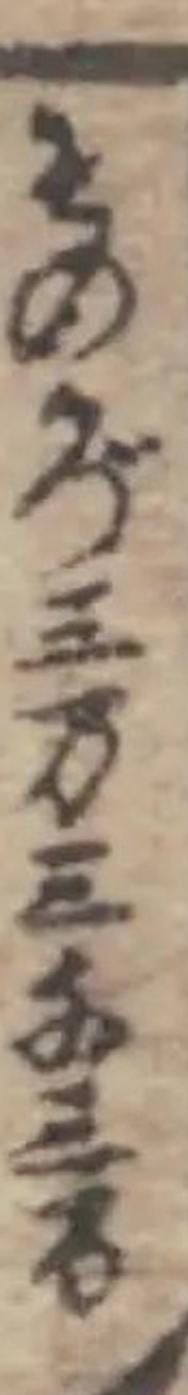そのかづ三万三千三百
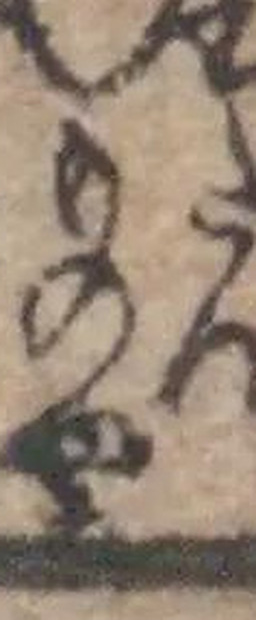ものや
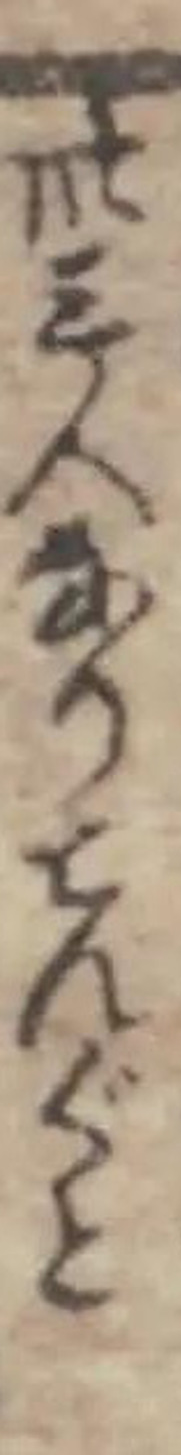卅三人なりてんぐと
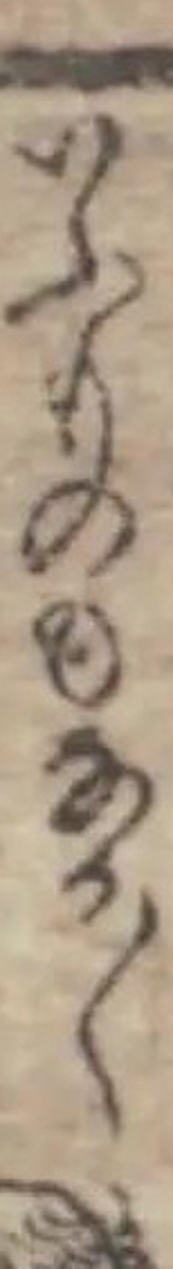いふものもなか〳〵
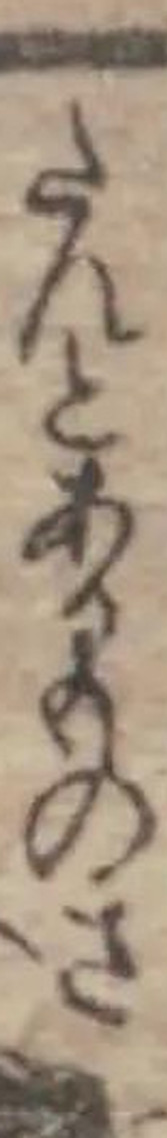たんとあるものさ
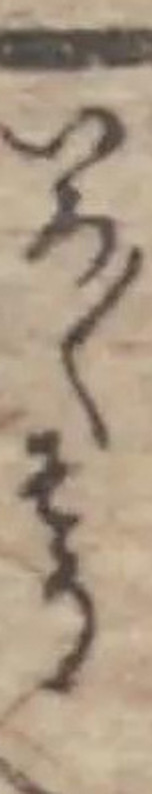いろ〳〵そう
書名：草紙の曙 3巻
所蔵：国立国会図書館 National Diet Library, JAPAN
